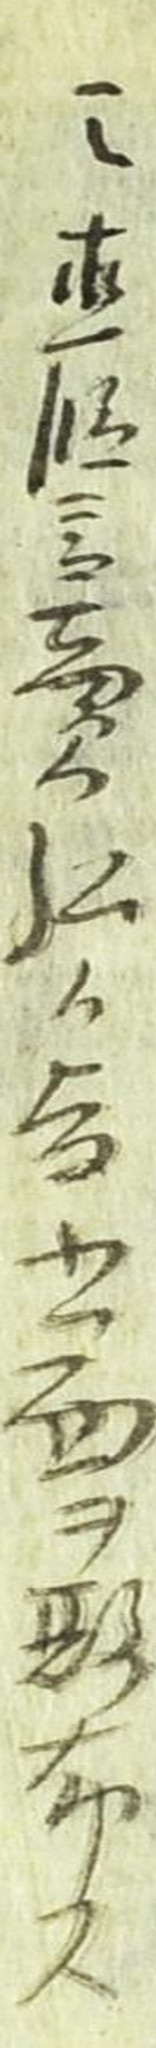之直段ニ而売弘候旨書面ヲ散布ス
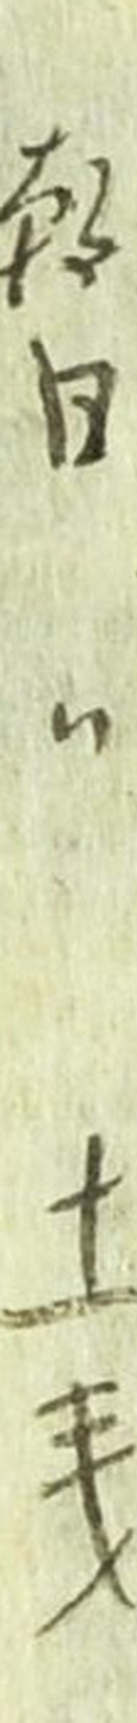朝日同十一㦮
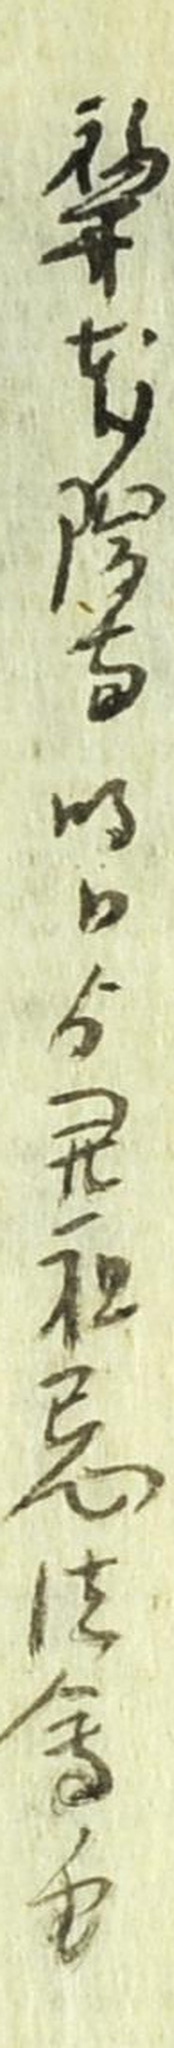福井本瑞寺明日ゟ開祖忌法会ノ由
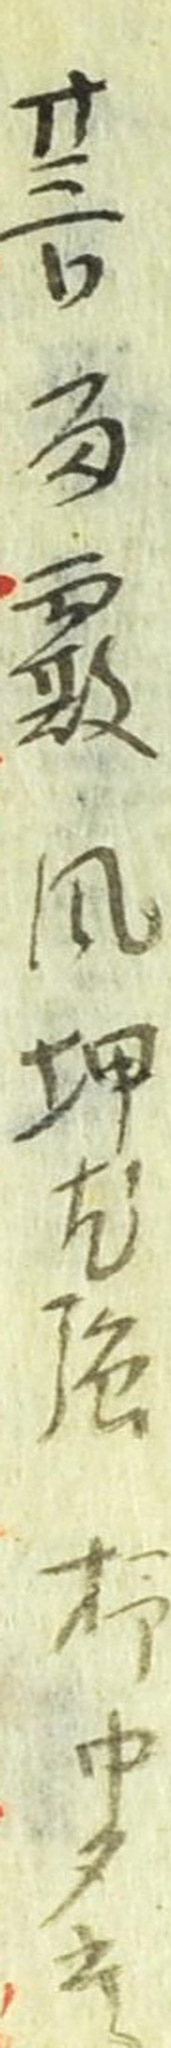廿三日雨霰風邪坤尤強柿中夕常

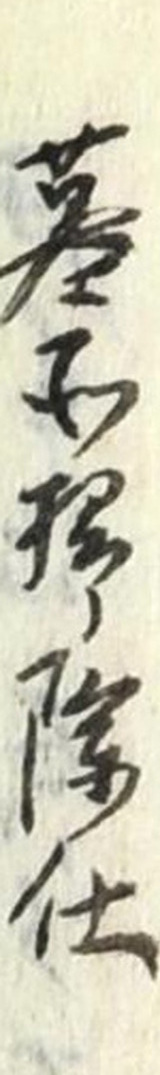墓所掃除仕
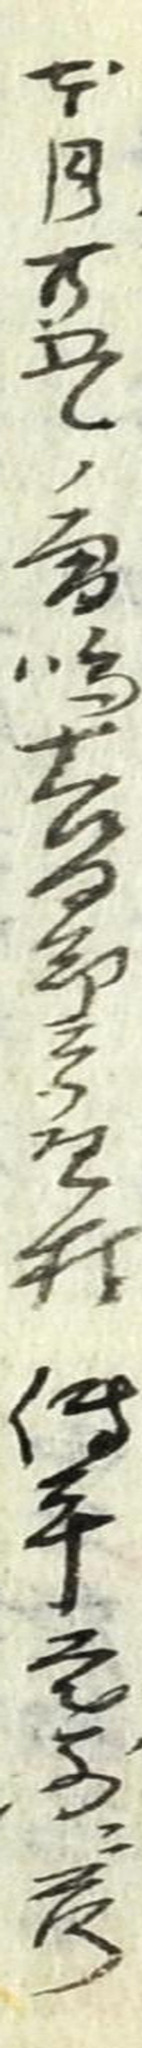本月廿五日ノ雷鳴吉田郡三ツ屋村伝平宅前ニ落
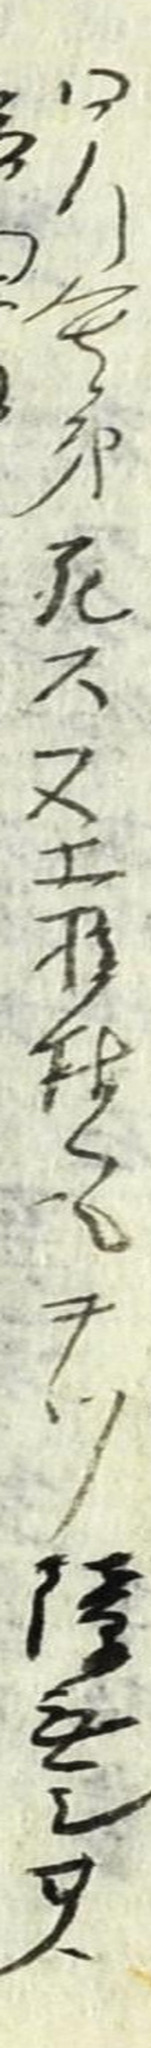同人舎弟死ス又土橋村へもヲツ障無シ其
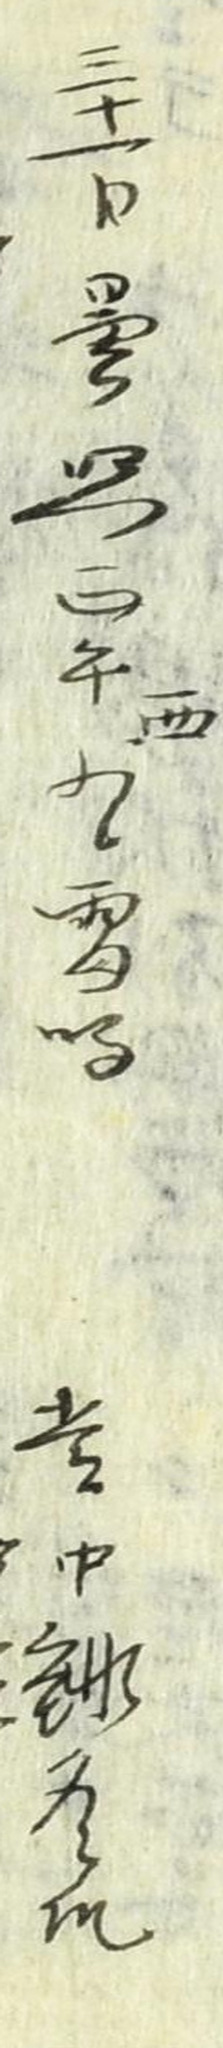三十一日曇照正午西少々雷鳴常中鯡冬瓜
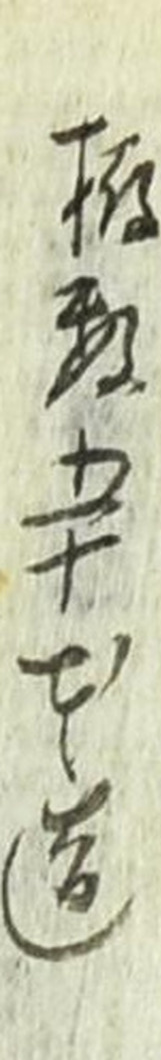拵数五十本造
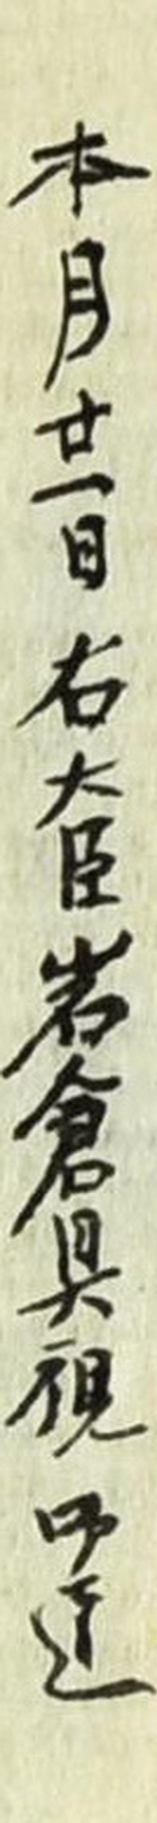本月廿一日右大臣岩倉具視御達
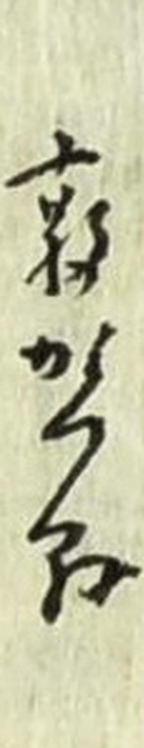敦賀県
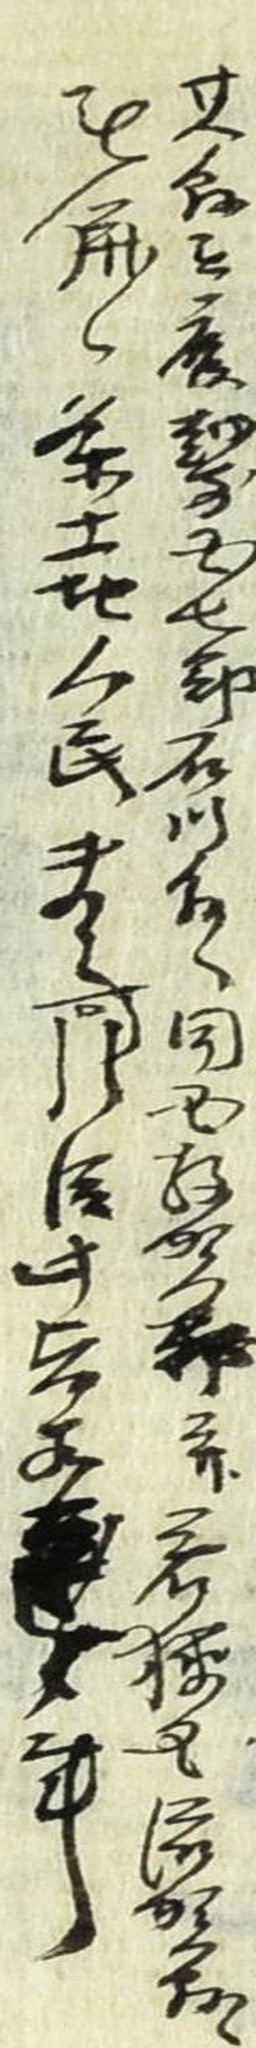被併候条土地人民夫々可引渡此旨相達候事
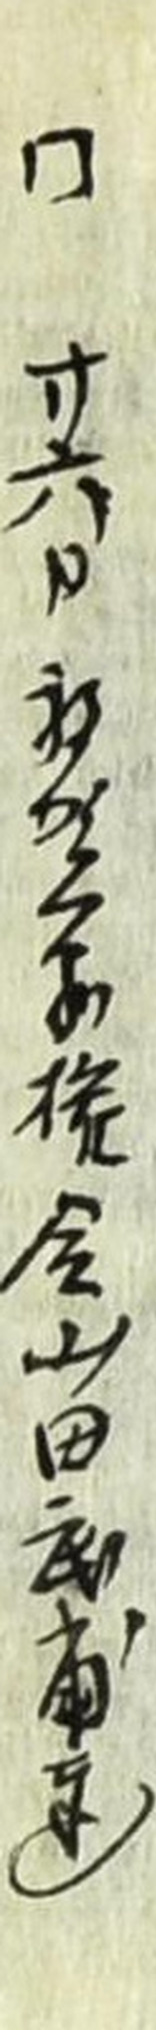同廿六日敦賀県権令山田武甫達
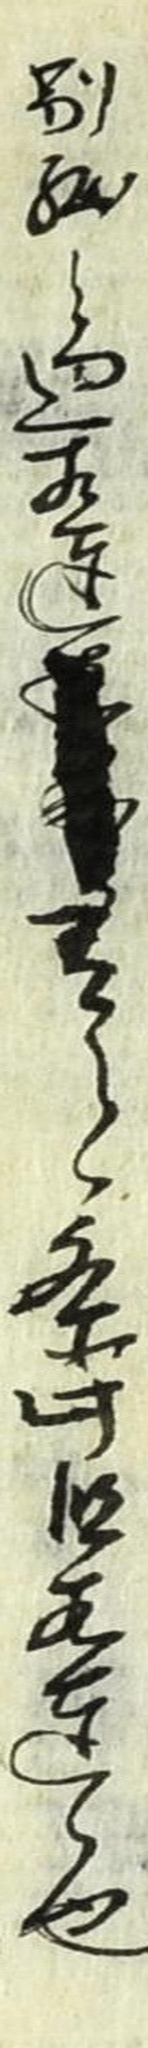別紙之通相達有之候条此段相達候也
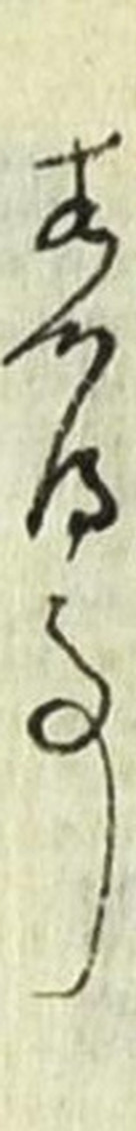相心得事

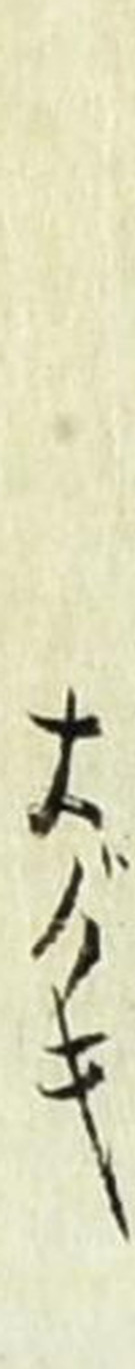大グキ
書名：（日記）
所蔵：福井県文書館 Fukui Prefectural Archives
